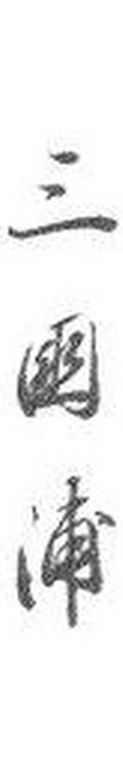三国浦
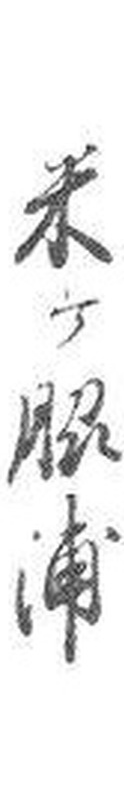米ケ脇浦
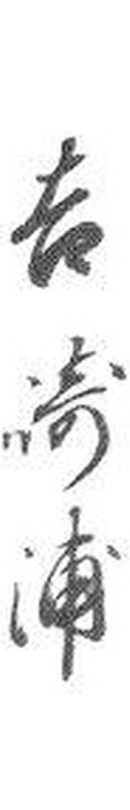吉崎浦
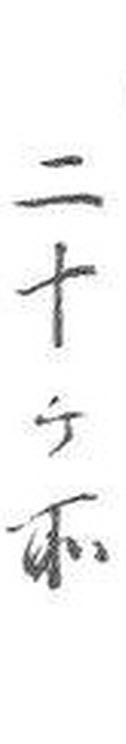二十ケ所
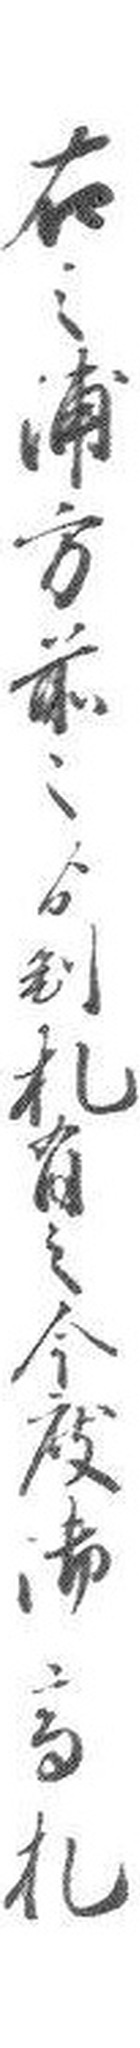右之浦方前々ゟ制札有之今度御高札
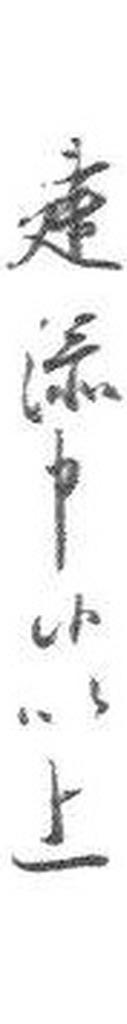建添申候以上
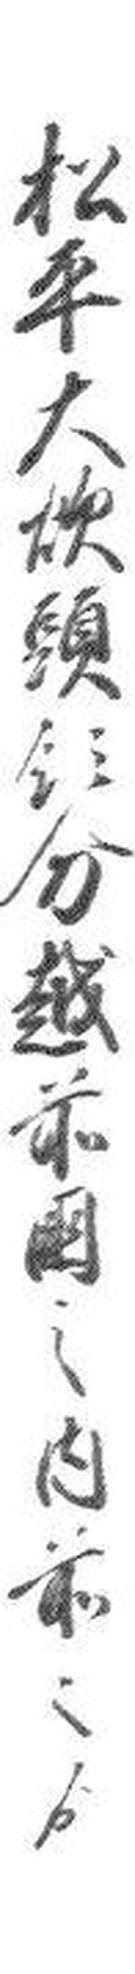松平大炊頭領分越前国之内前々ゟ
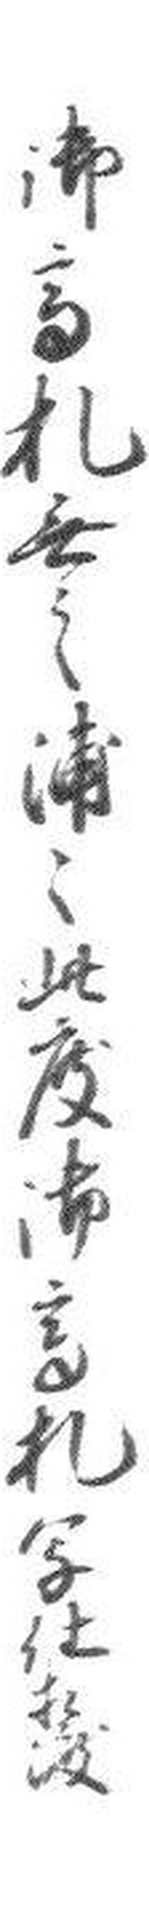御高札無之浦々此度御高札写仕相渡
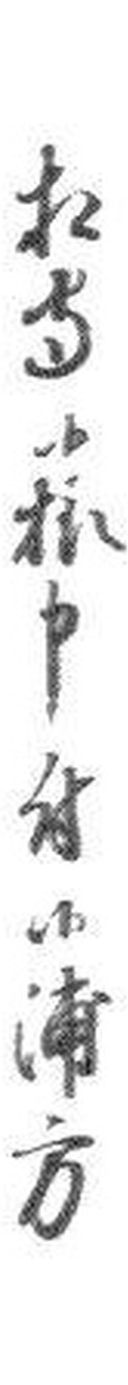相守候様申付候浦方
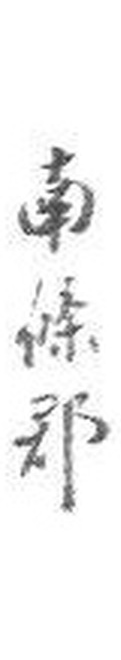南条郡
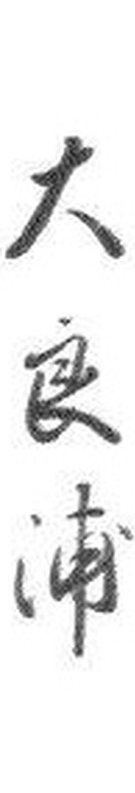大良浦
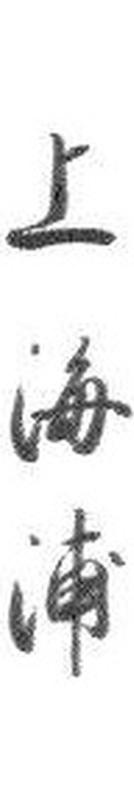上海浦
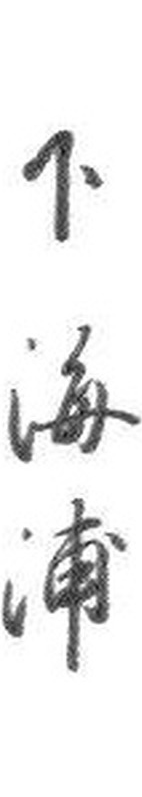下海浦
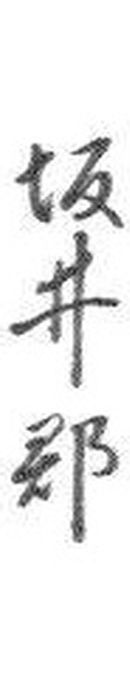坂井郡

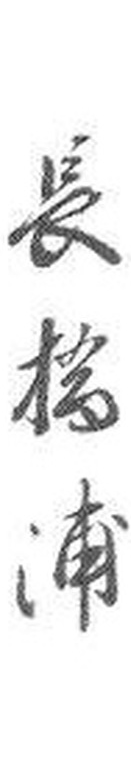長橋浦
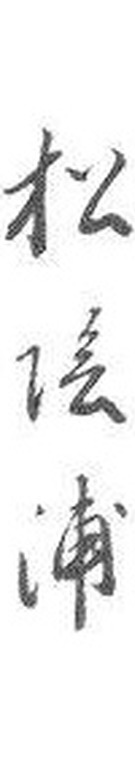松陰浦
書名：家譜 二十九 吉邦公 従正徳二年到正徳三年
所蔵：福井県文書館 Fukui Prefectural Archives
